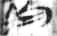於
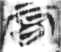晨
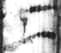工（空）
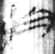於
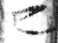巳
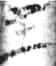坐
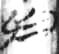於
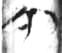午
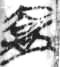盍（蓋）
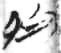於
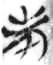未
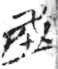城（成）
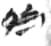於
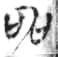申
